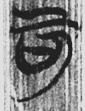可
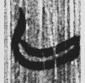㠯（以）
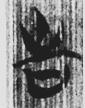告
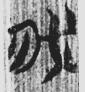我
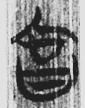○（答）
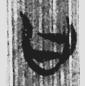曰
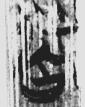○（僕）
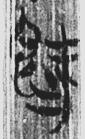既
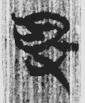○（得）
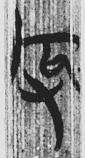辱
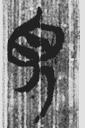○（視）
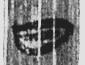日
